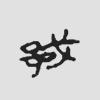國
